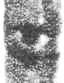四
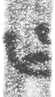曰
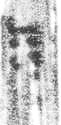咸
